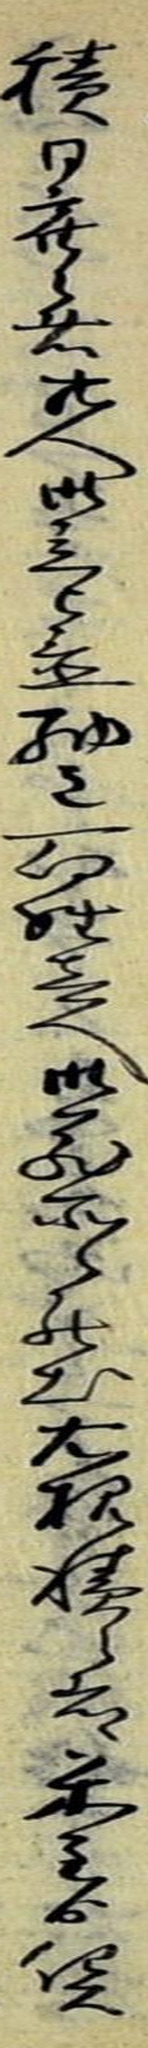積日雇之者廿人御立被置納主百姓壱人御蔵所へ罷出右根積之者へ米主ゟ賃
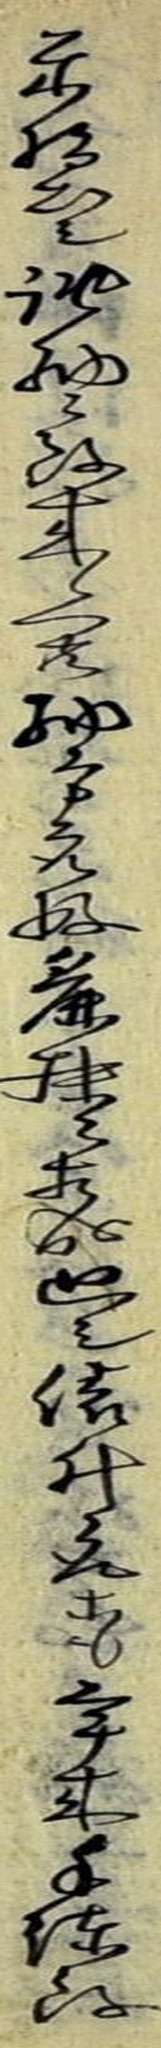米指出シ誂納ニ致来候へ共納方取扱麁抹ニ相成廻シ俵升取等も年来手練致
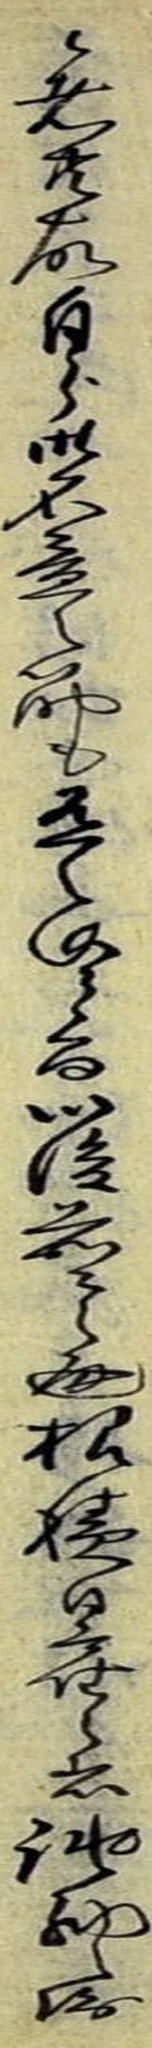候者共故自分御不益之筋も有之趣ニ候間以後前々之通根積日雇之者誂納之儀
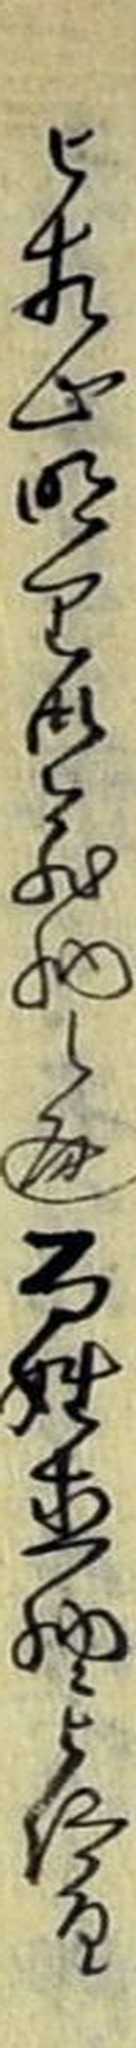被相止明里御蔵納之通百姓直納ニ被仰付候
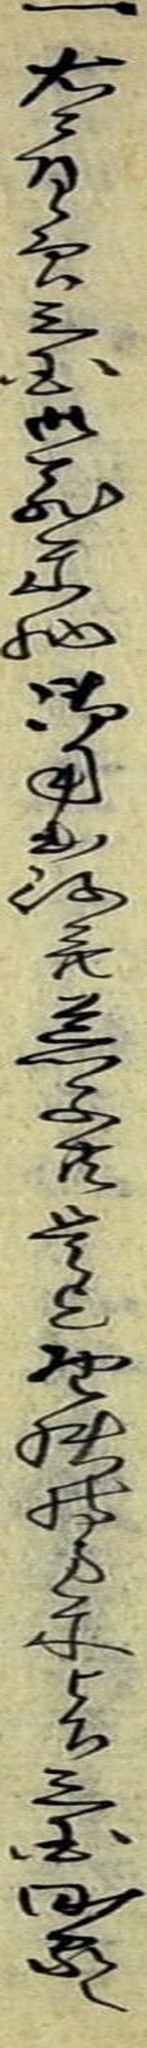一右ニ付候而ハ三国御蔵米納御用出役并荒子共是迄野扶持方米被下三国町家之
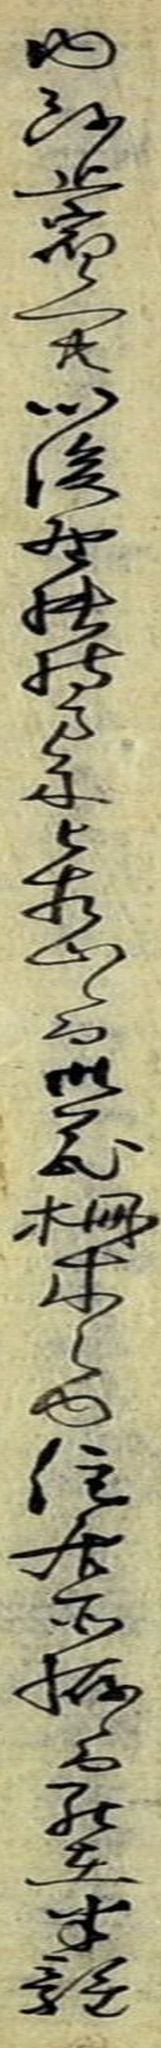内致止宿候へ共以後野扶持方米被相止候而御蔵柵木之内住居所拵候而罷在
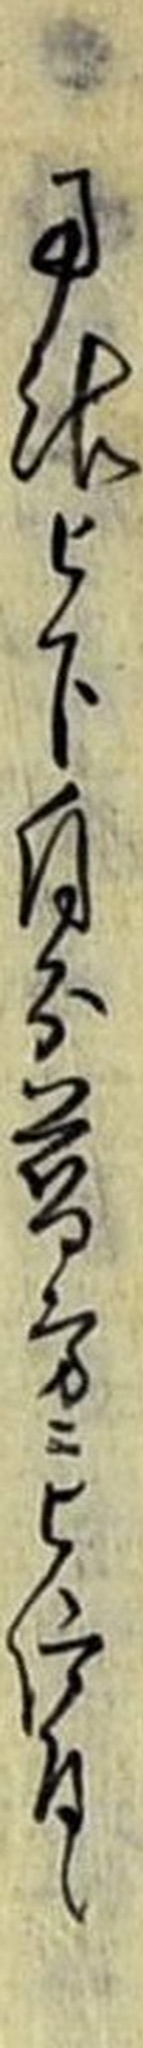用銀被下自分暮方ニ被仰付候
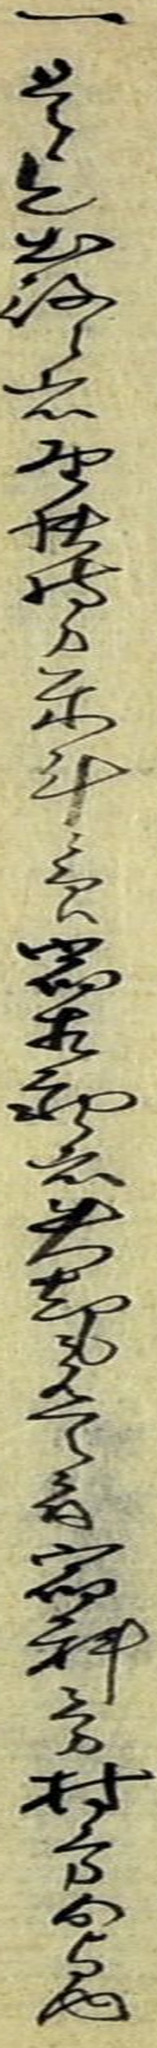一是迄出役之者野扶持方米斗ニ而ハ宿相勤候者失却も有之ニ付宿料方村方ゟ与内
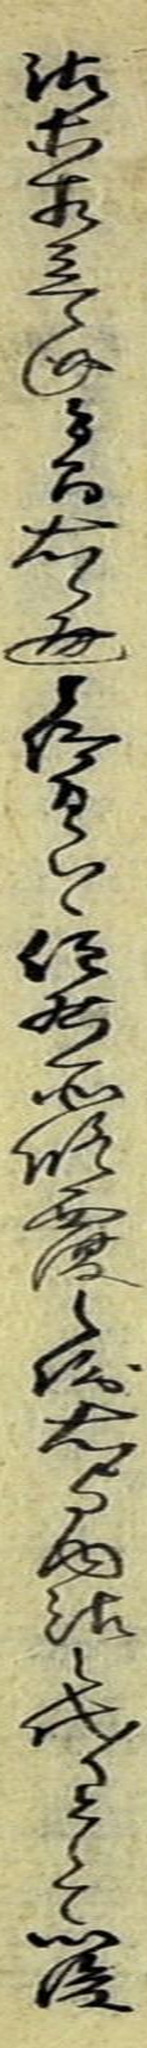銀等相立候趣ニ候間右之通被仰付候ハヽ住居所修覆之儀右与内銀之代りとして以後
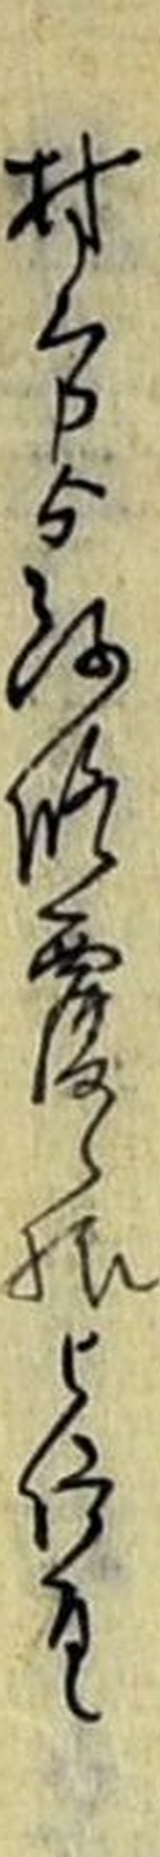村方ゟ致修覆候様被仰付候
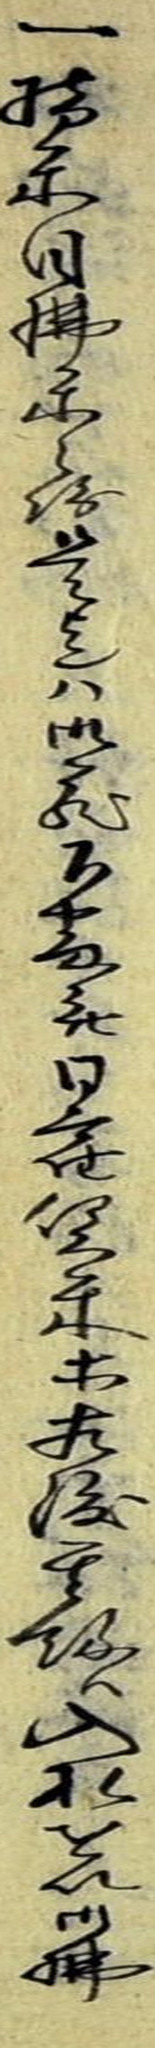一指米目払米之儀是迄ハ御蔵下番并日雇賃米等相渡其余ハ入札を以御払
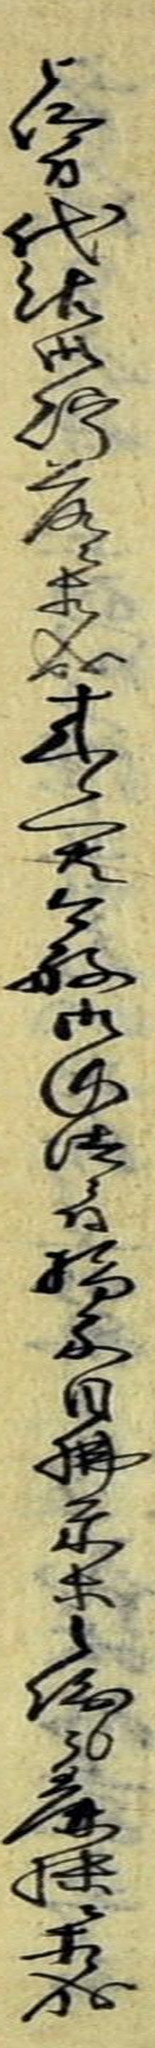被仰付代銀御貯落ニ相成来候へ共今般御趣法ニ付指米目払米等之儀も麁抹ニ相成

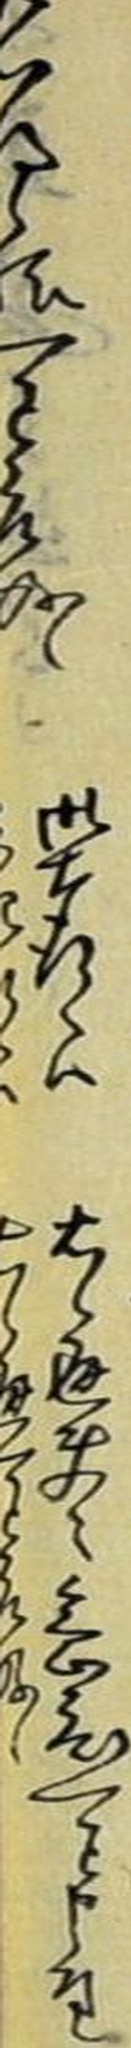段相心得候様可被取扱候御奉行ヘハ右之通夫々急度可被申付候
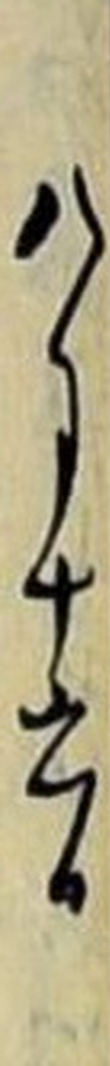八月十六日

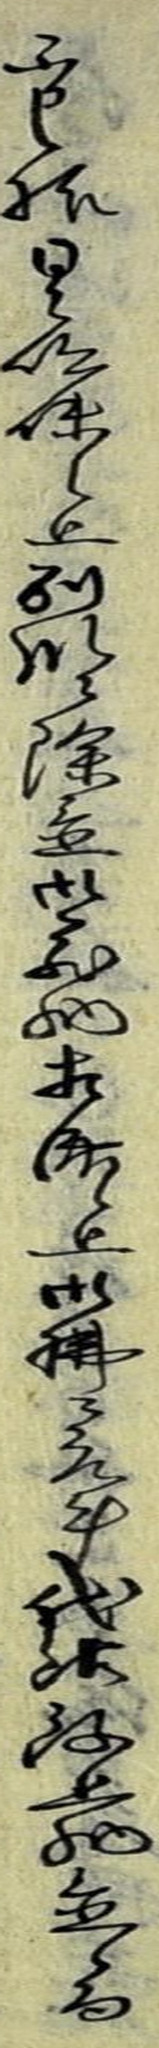不申様日々吟味之上別段ニ除置御蔵納相済候上御払ニ取計代銀致上納置候而
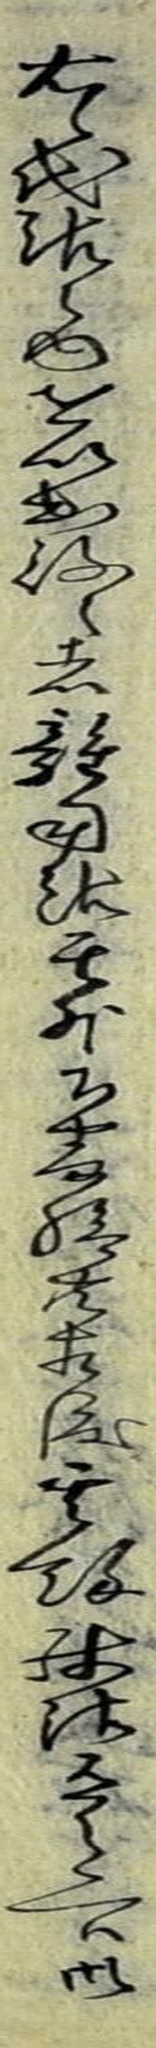右之代銀之内を以出役之者雑用銀其外下番給共相渡其余残銀有之候ヘハ御
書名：命令之部 三
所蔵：福井県文書館 Fukui Prefectural Archives
